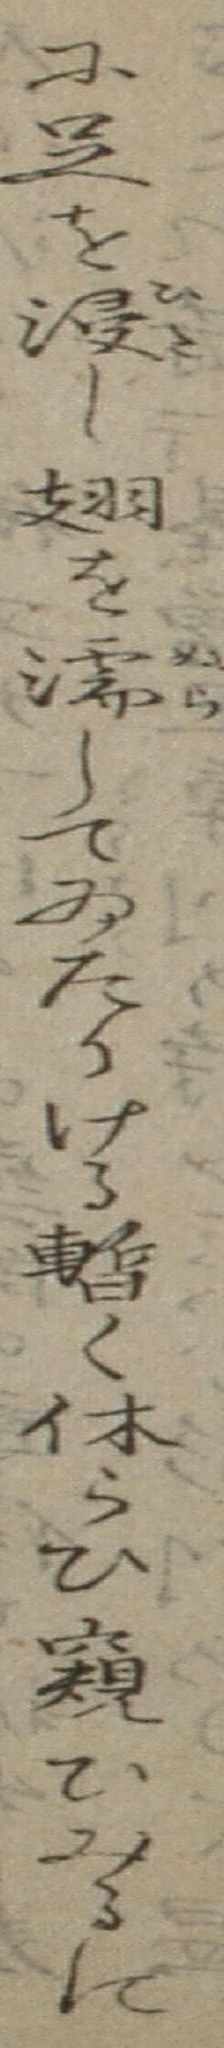に足を浸し翅を濡してゐたりける暫く休らひ窺ひみるに
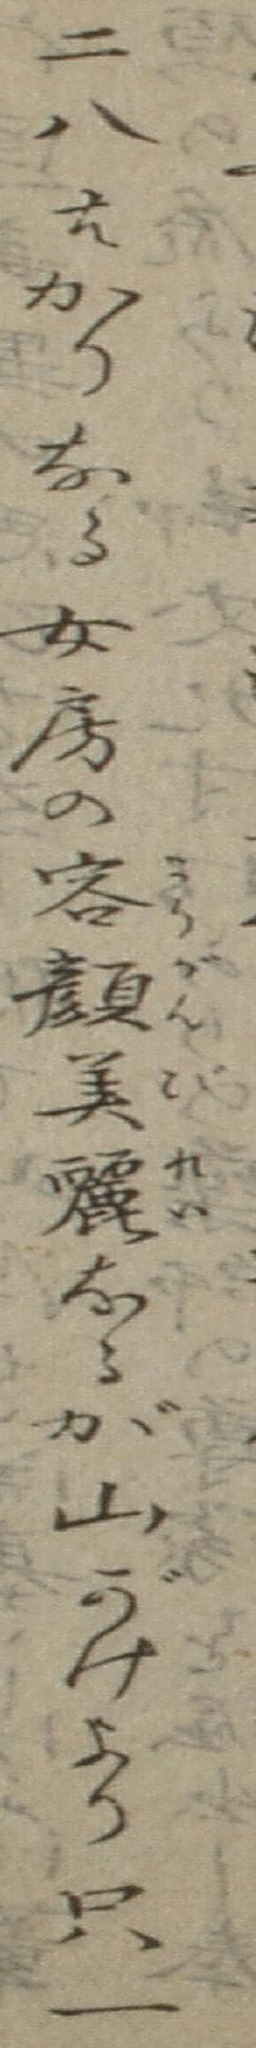二八はかうなる女房の容顔美麗なるが山がけより只一
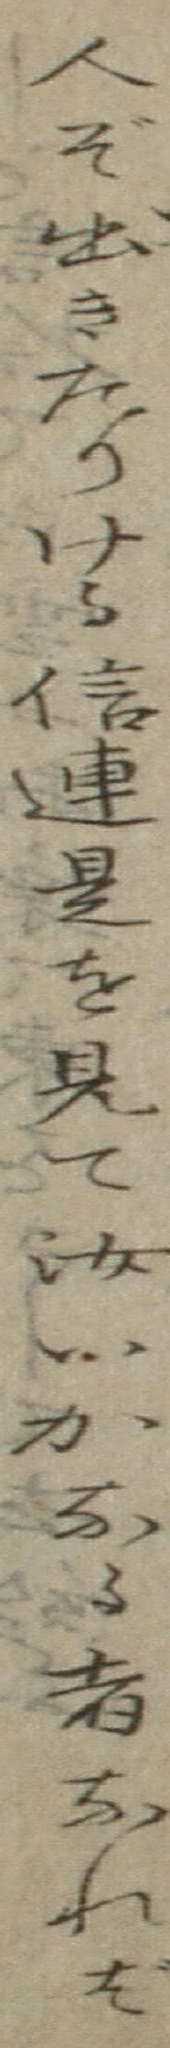人ぞ出きたりける信連是を見て汝いかなる者なれば
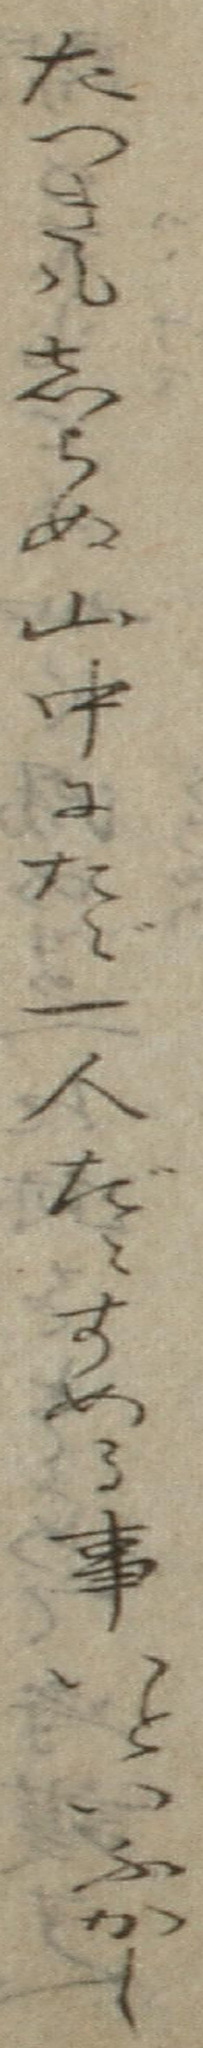たつきもしらぬ山中にたゞ一人だゝすめる事いといふかし
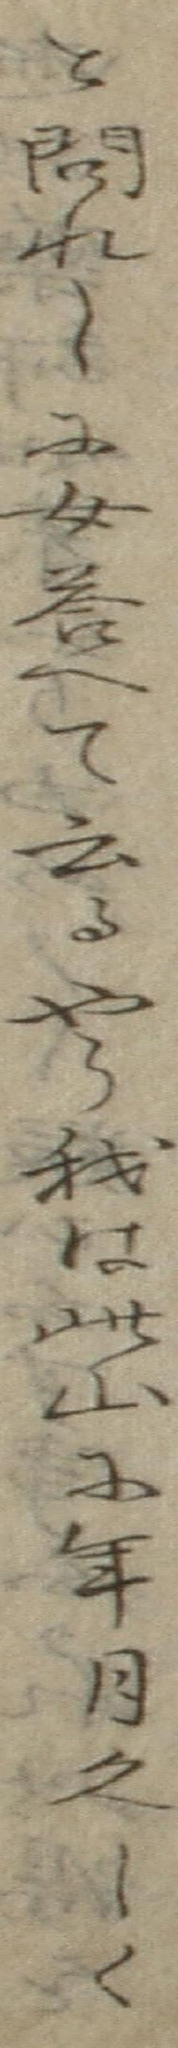と問れしに女答へて云ふやう我は此山に年月久しく
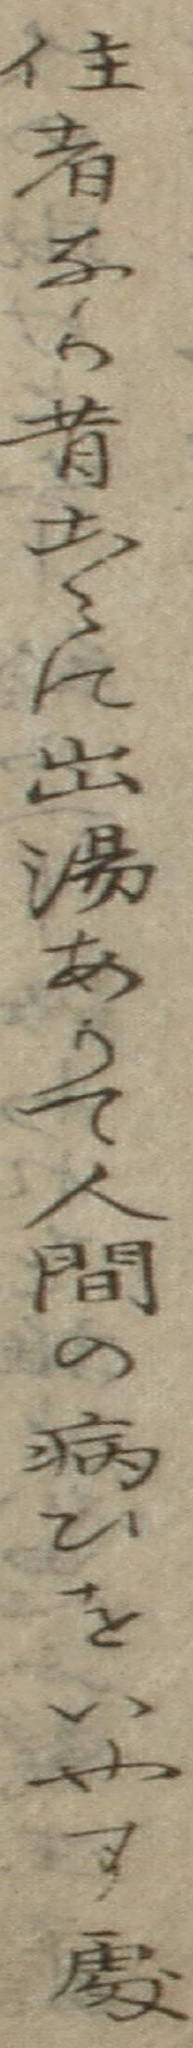住者なり昔こゝに出湯ありて人間の病ひをいやす処
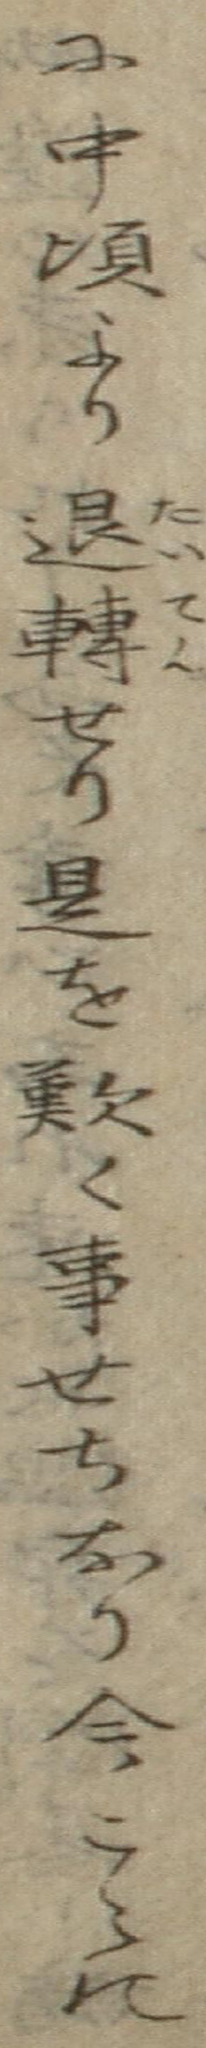に中頃より退転せり是を歎く事せちなり今こゝの

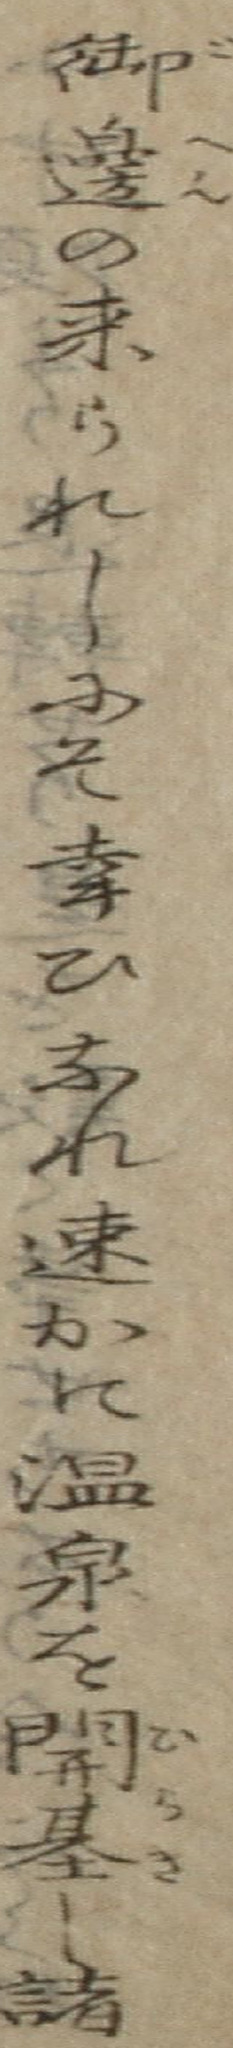御辺の来られしにそ幸ひなれ速かに温泉を開基し諸
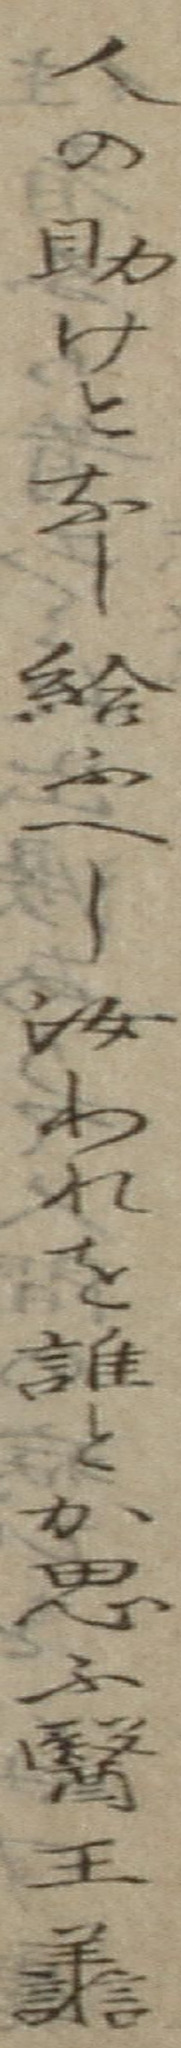人の助けとなし給ふへし汝われを誰とか思ふ医王善
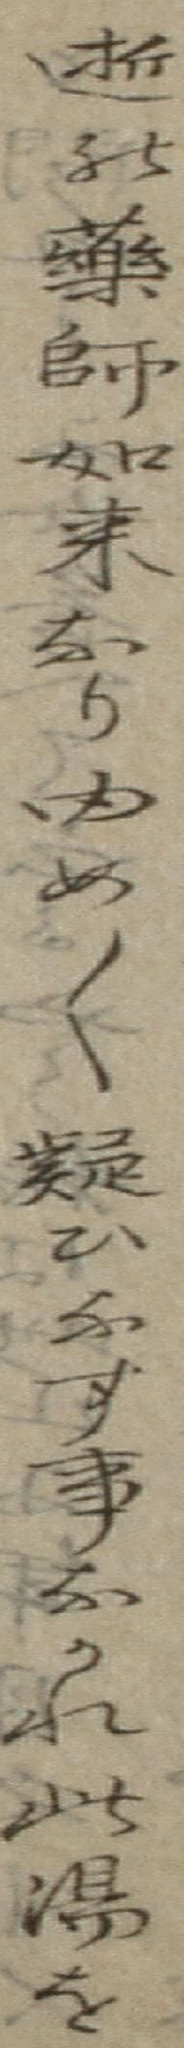逝の薬師如来なりゆめ〳〵疑ひなす事なかれ此湯を
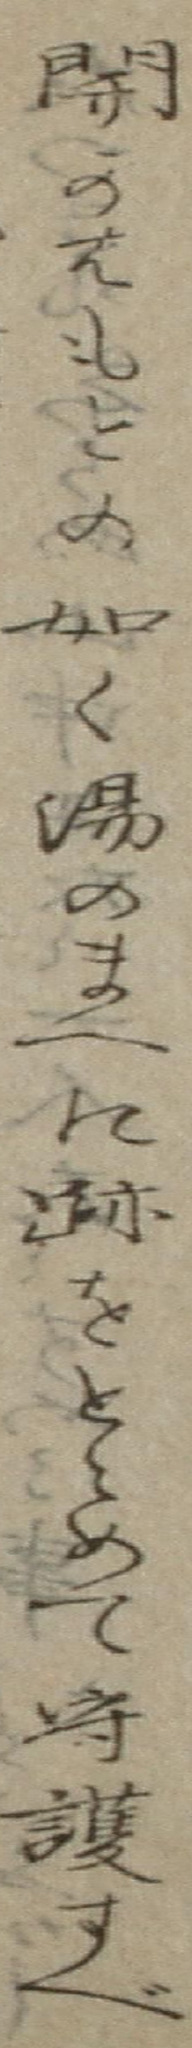開かはもとの如く湯にまへに跡をとゝめて守護すべ
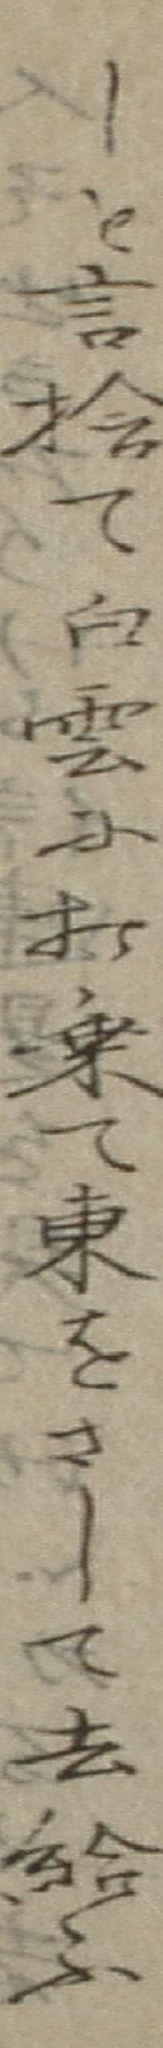しと言捨て白雲に打乗て東をさして去給ふ
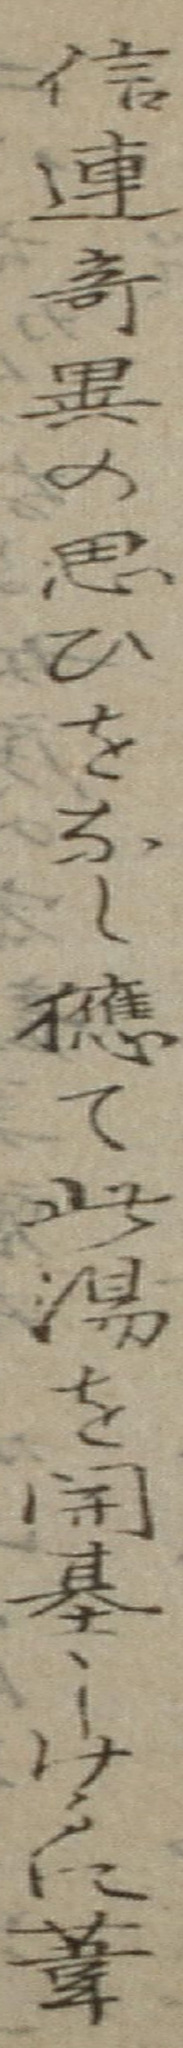信連奇異の思ひをなし軈て此湯を開基しけるに葦
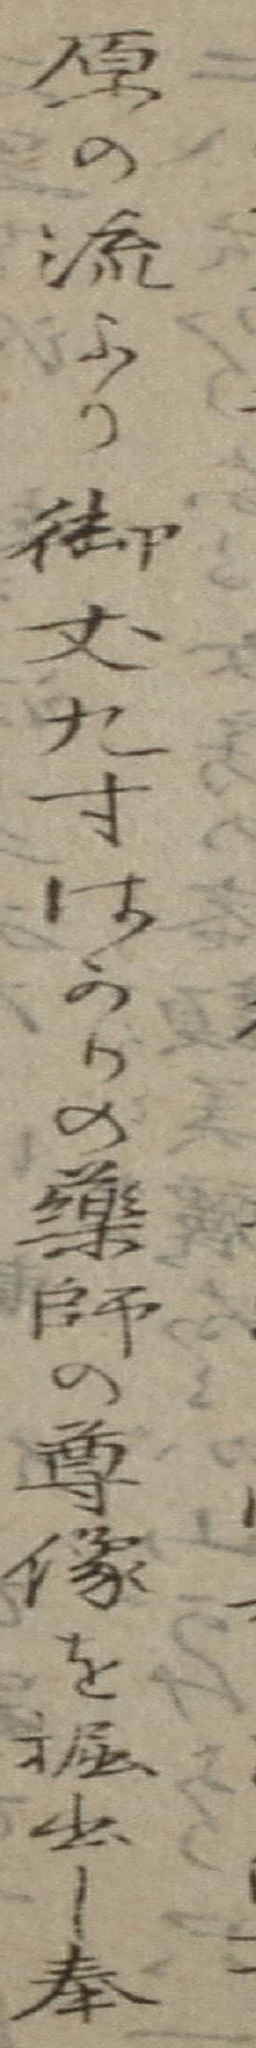原の流より御丈九寸はかりの薬師の尊像を掘出し奉
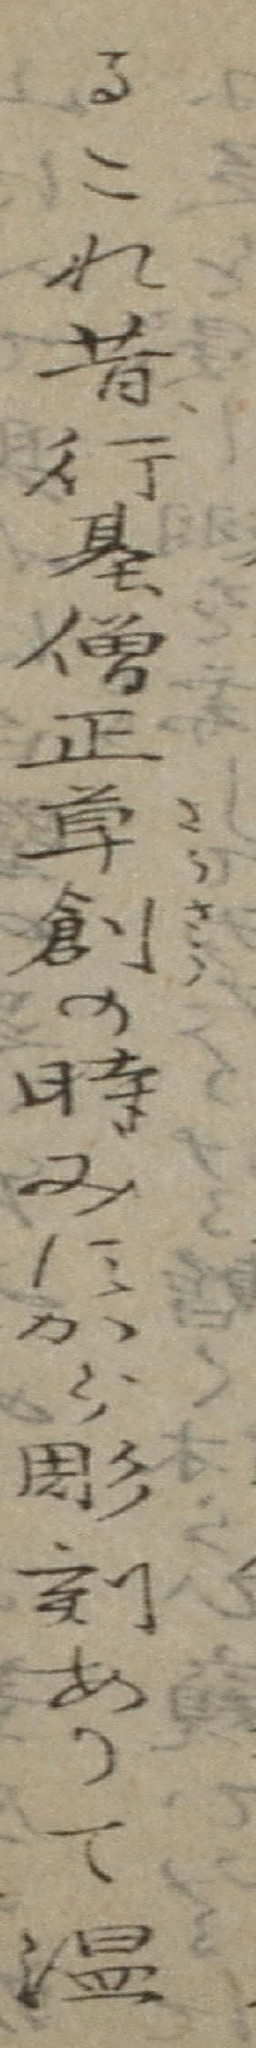るこれ昔行基僧正草創の時みすから彫刻ありて温
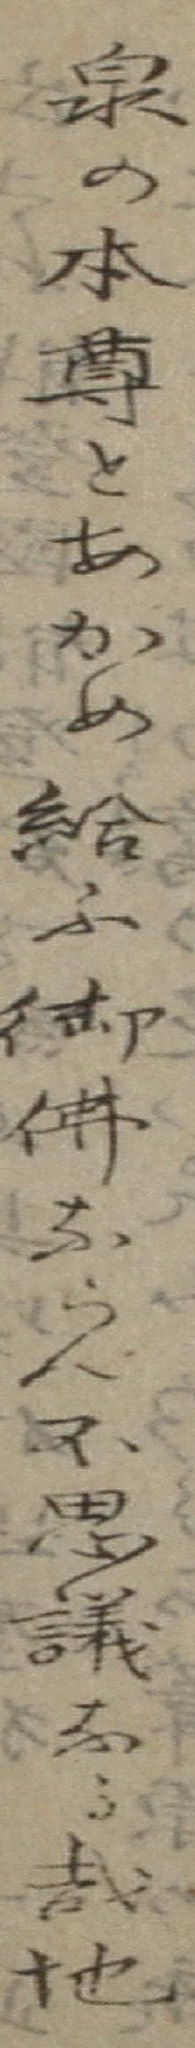泉の本尊とあかめ給ふ御仏ならん不思議なる哉地
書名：山中温泉縁記并ニ入浴之心得
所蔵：東京大学地震研究所図書室 Earthquake Research Institute Library, The University of Tokyo, JAPAN
